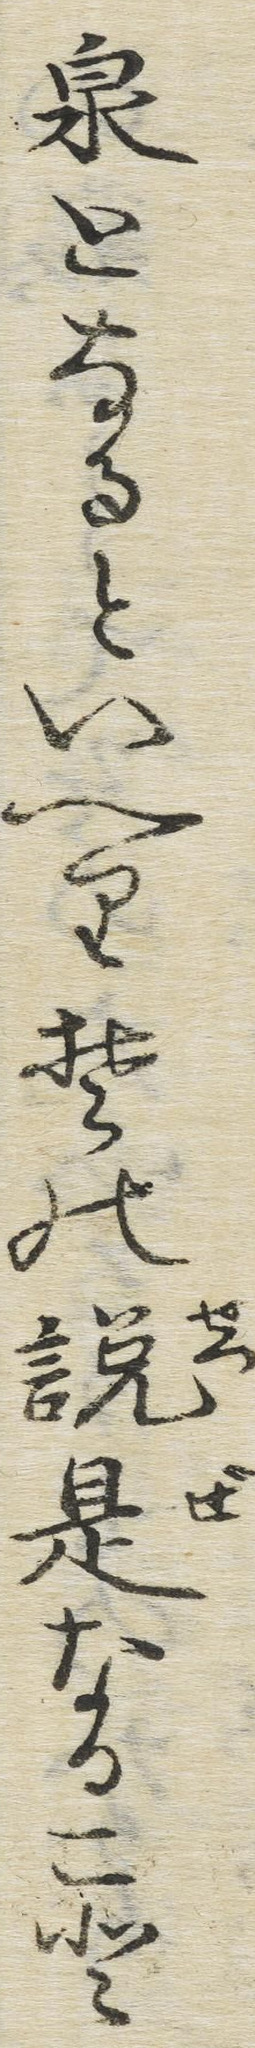泉となるといへりその説是なること
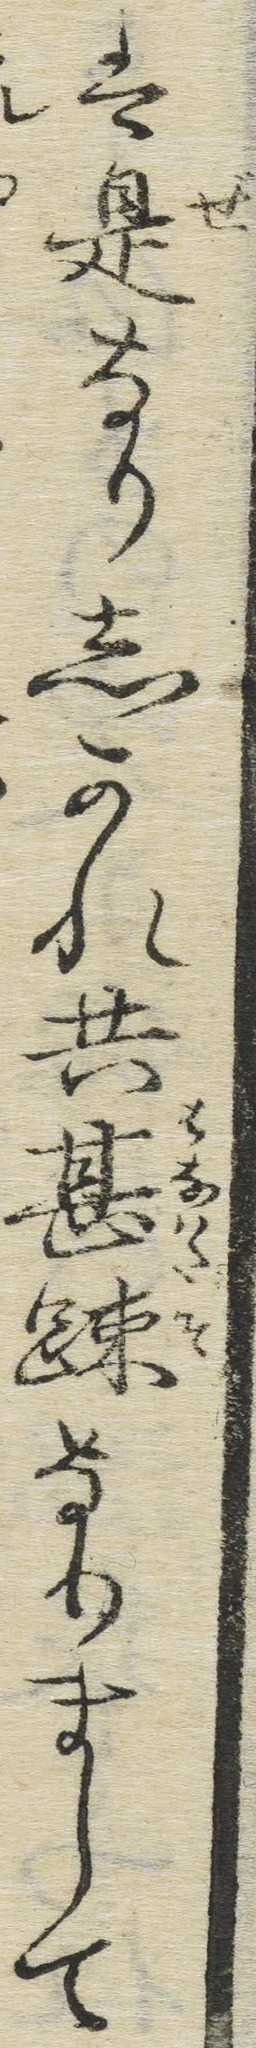は是なりしかれ共甚疎なりまして
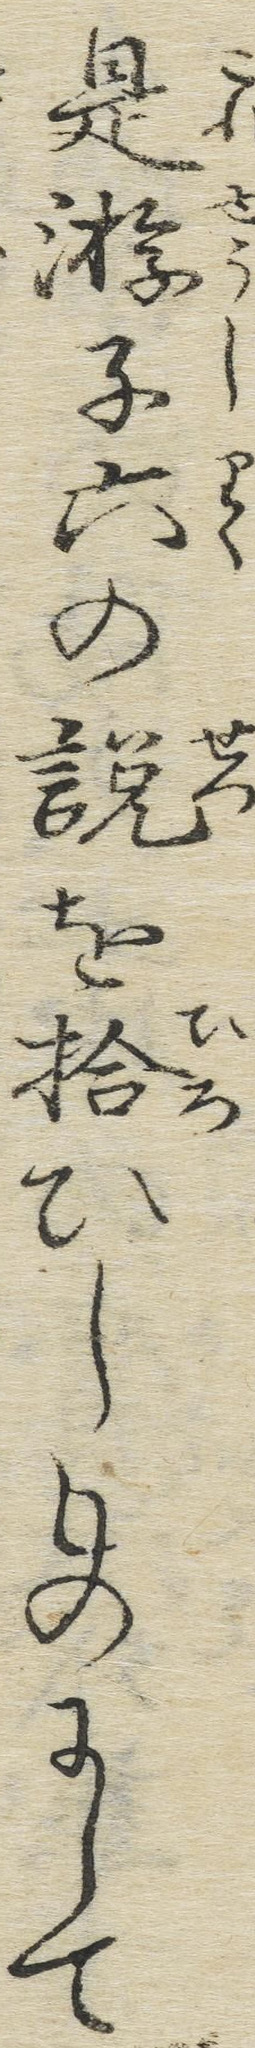是游子六の説を拾ひしものにして
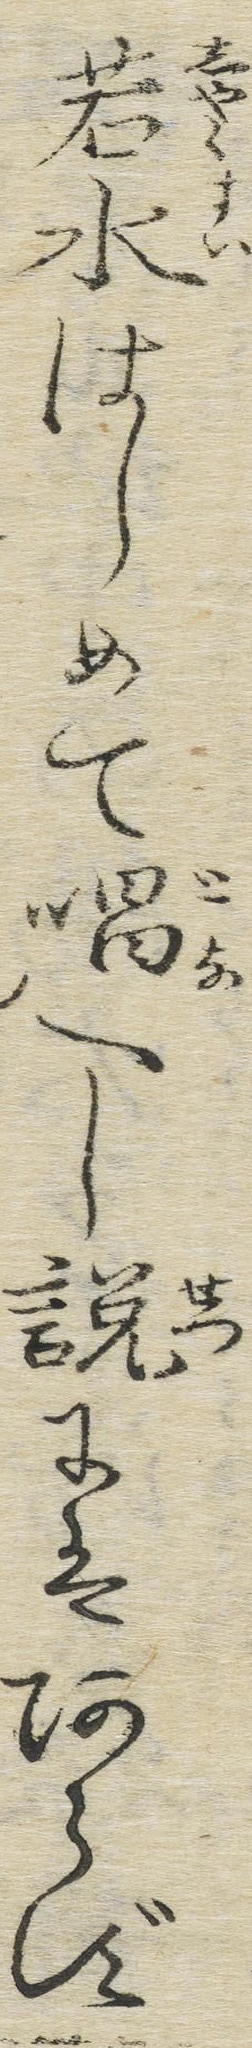若水はしめて唱へし説にはあらず
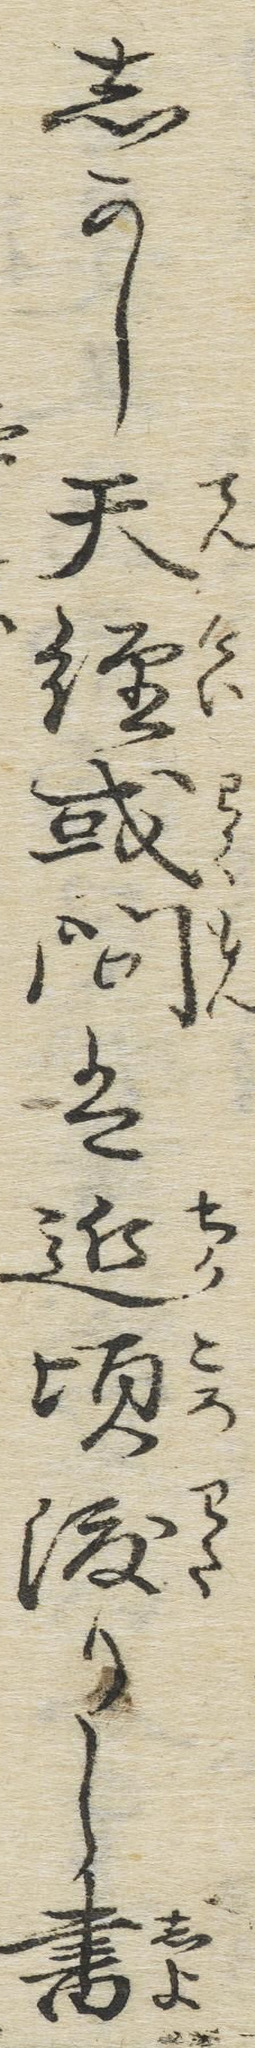しかし天経或文は近頃渡りし書
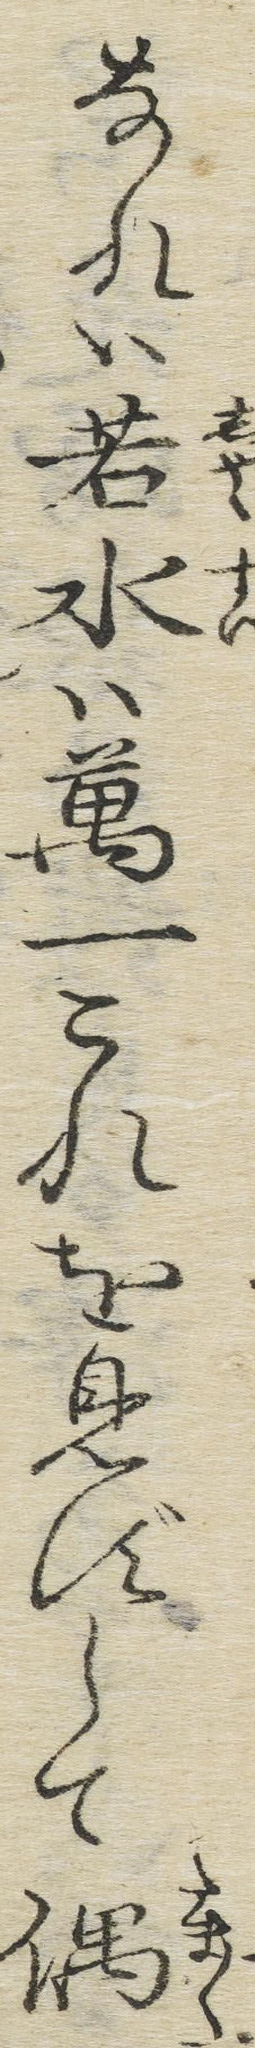なれは若水は万一これを見ずして偶
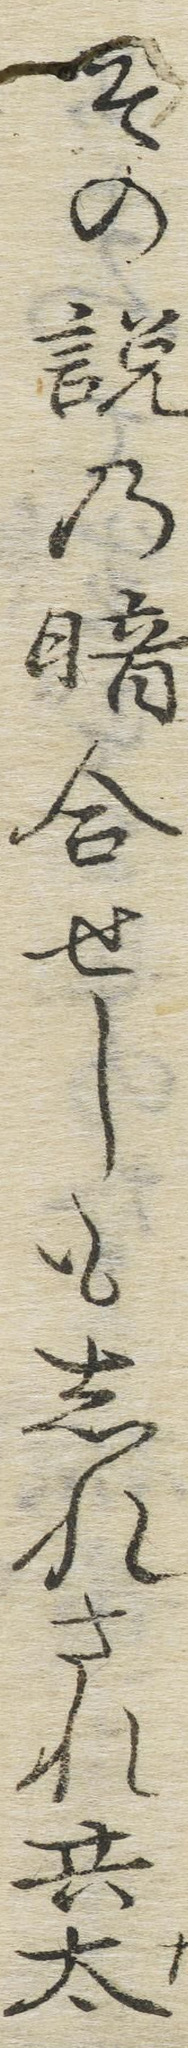その説の暗合せしもしれされ共太
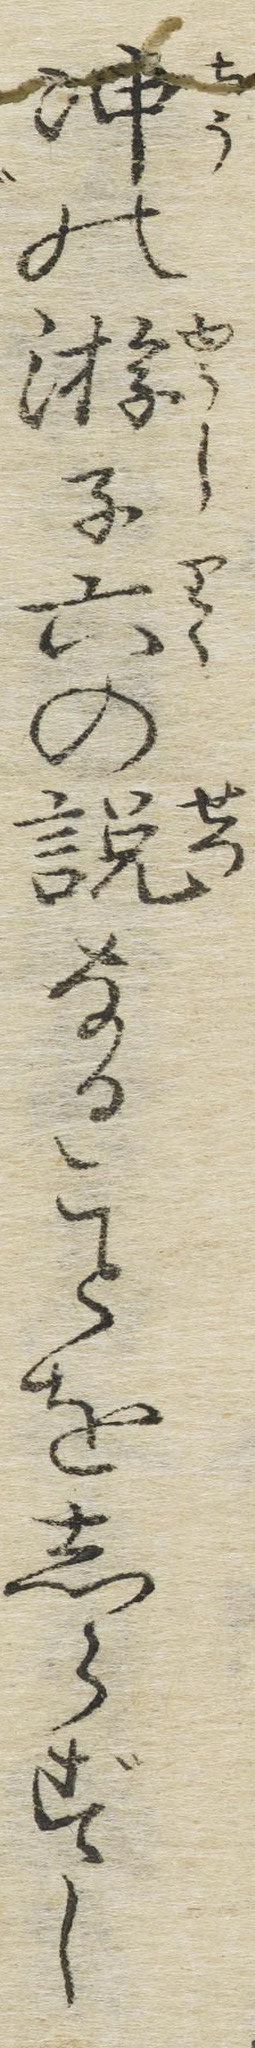冲の游子六の説なることをしらずし
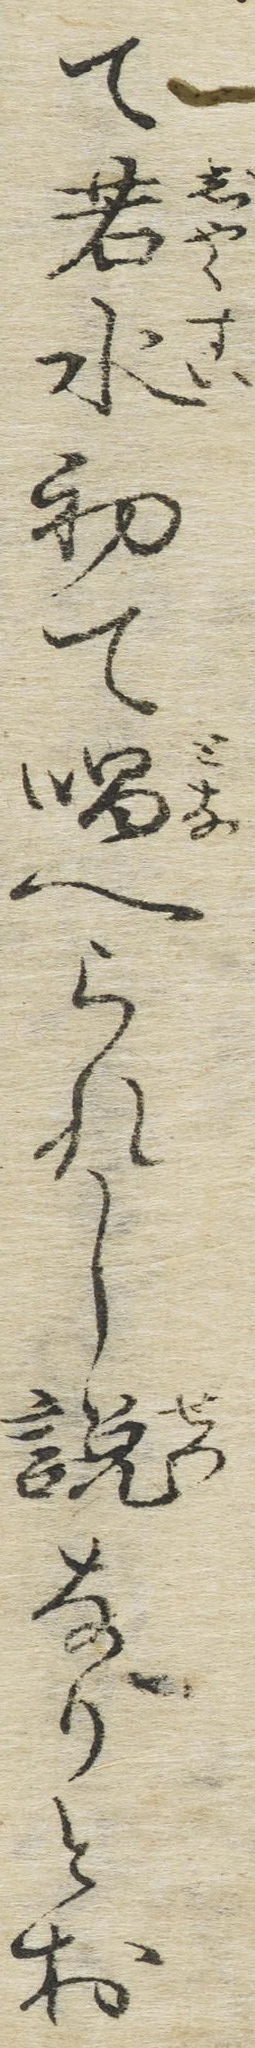て若水初て唱へられし説なりとお

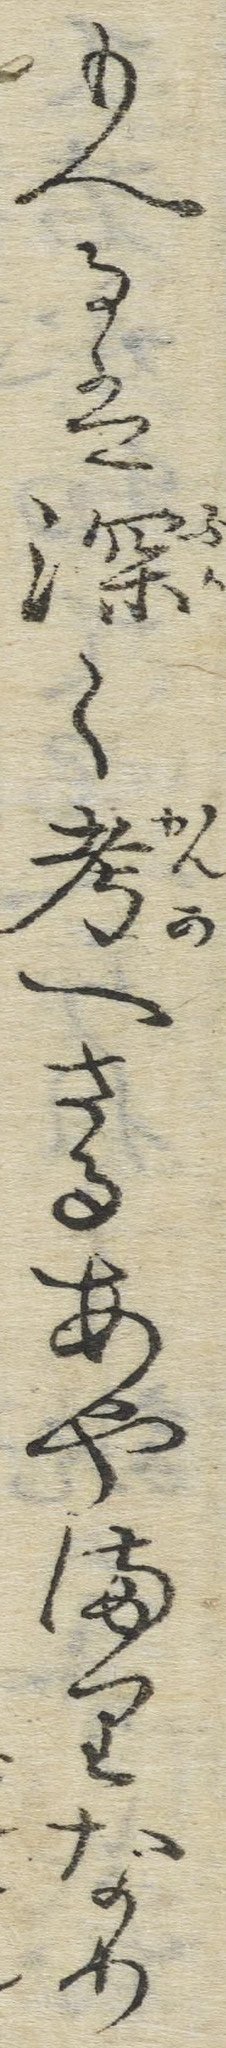もへるは深く考へさるあやまりなり又
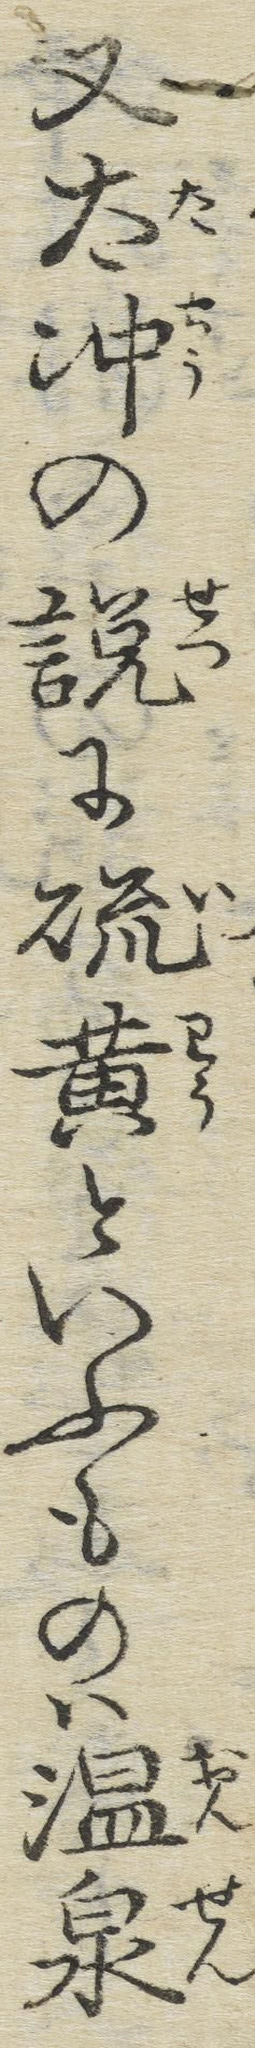太冲の説に硫黄といふものは温泉
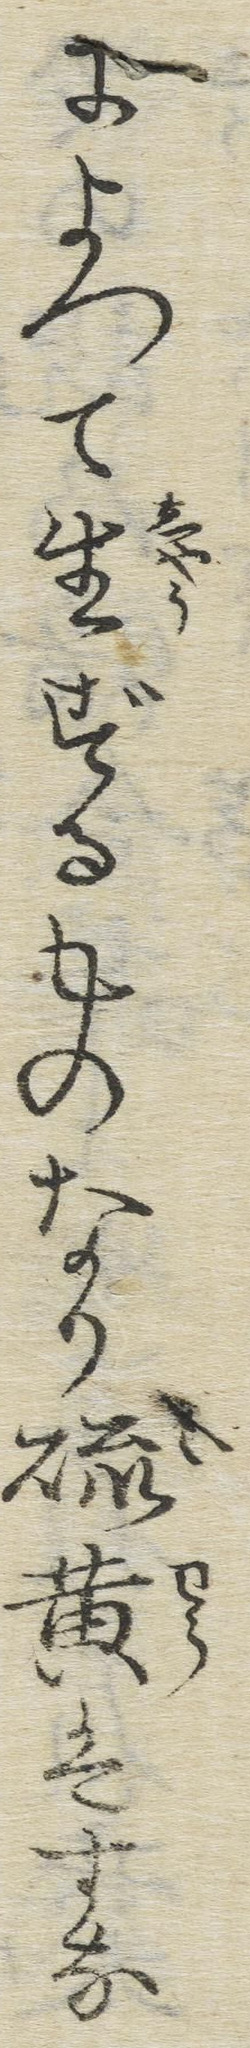によつて生ずるものなり硫黄はすな
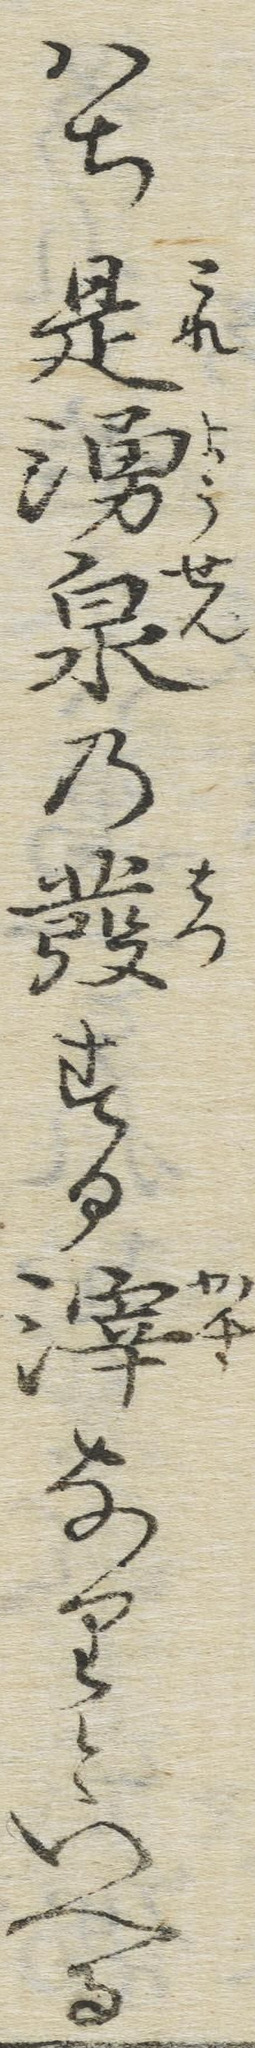はち是湧泉の発する滓なりといへる
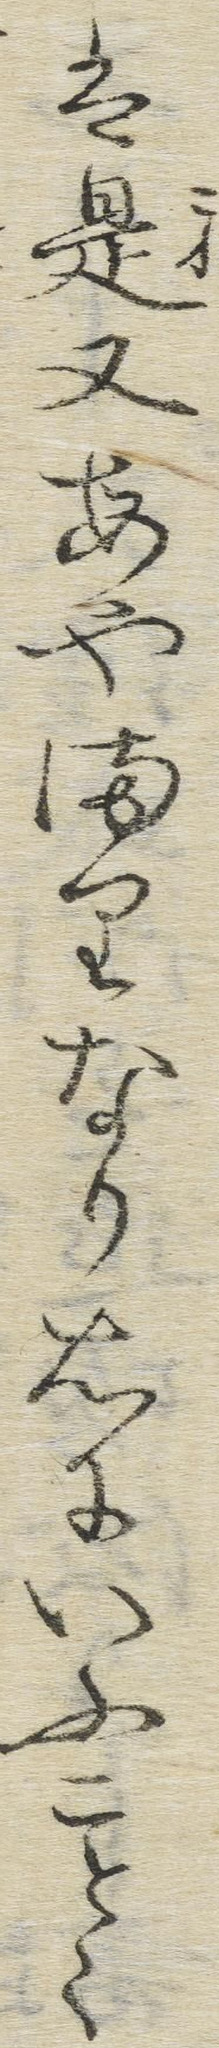は是又あやまりなり右にいふことく
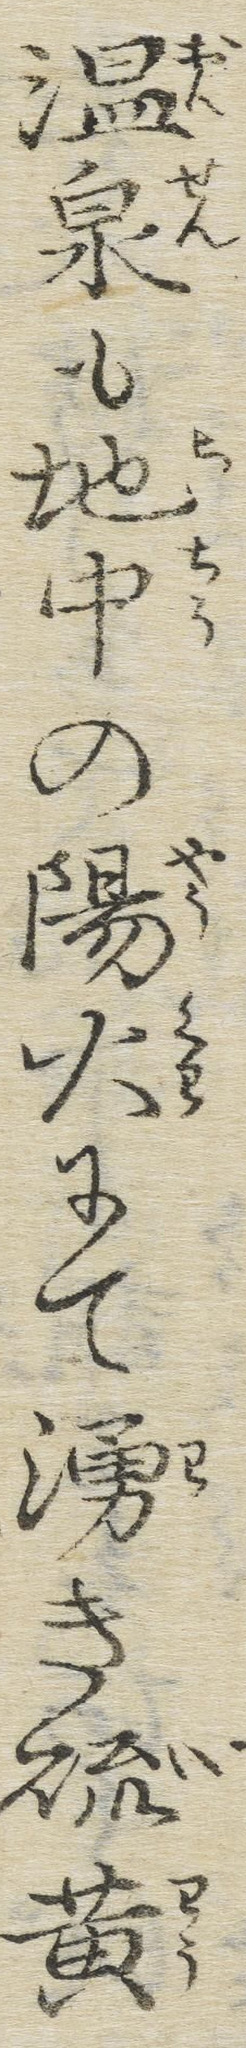温泉も地中の陽火にて湧き硫黄
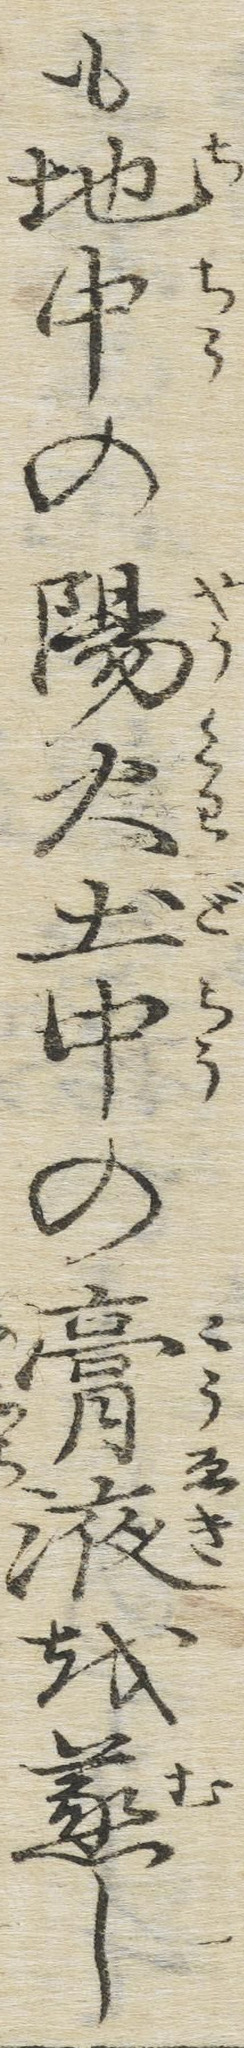も地中の陽火土中の膏液を蒸し
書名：温泉考
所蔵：東京大学地震研究所図書室 Earthquake Research Institute Library, The University of Tokyo, JAPAN
